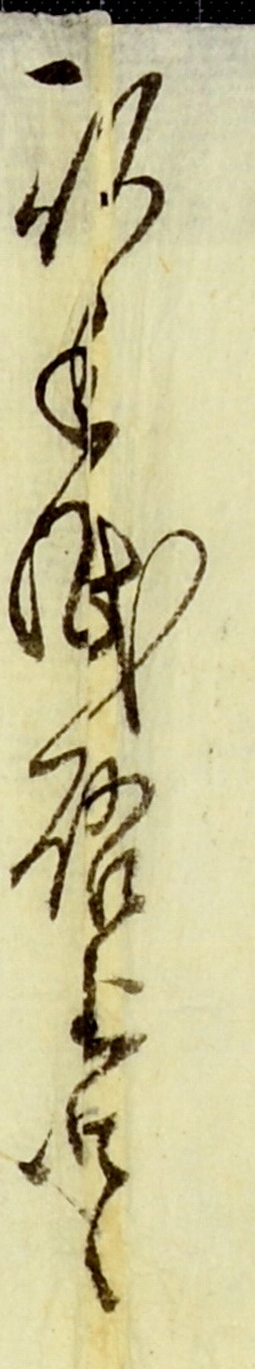以手紙啓上仕候
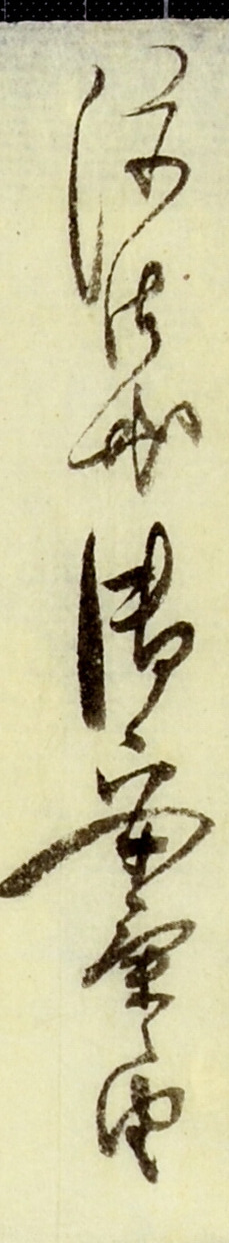弥御地御安気之由
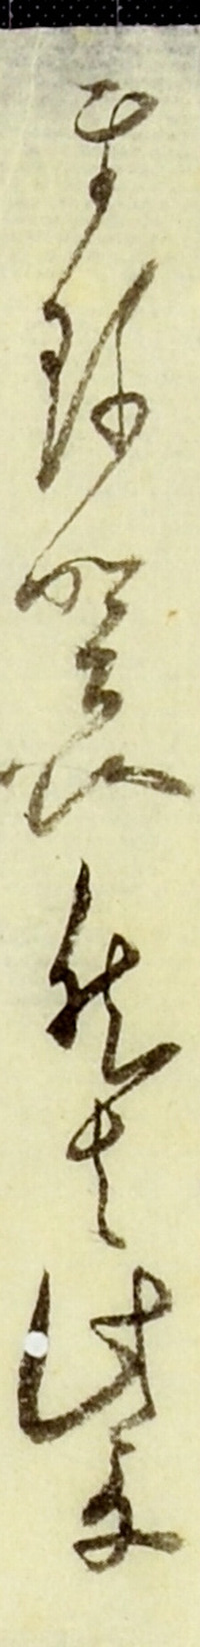奉珍賀候然は此度
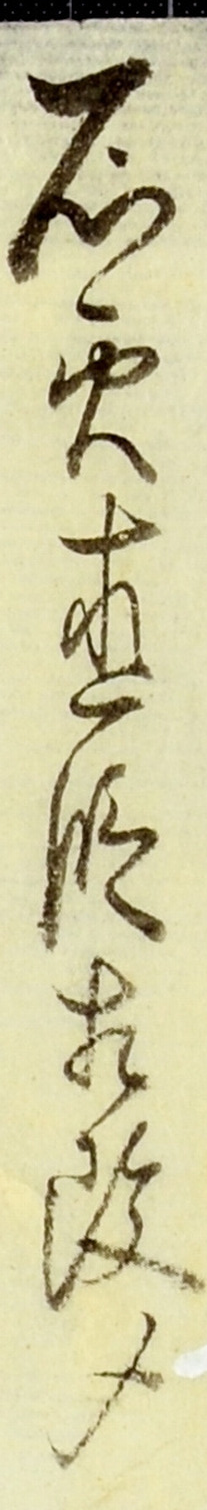石灰直段相改メ
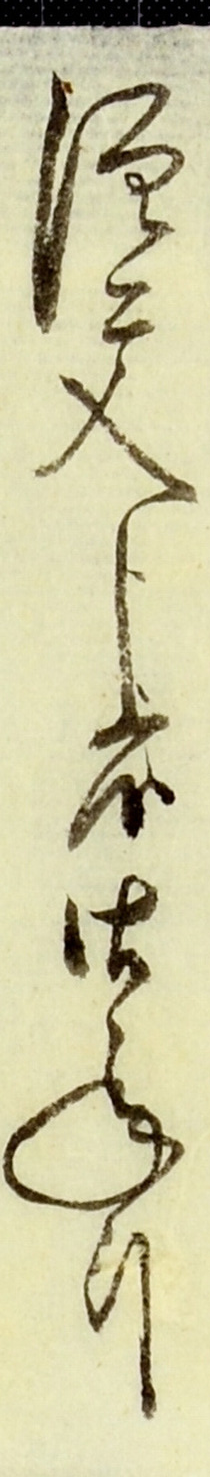注文申上候御承引
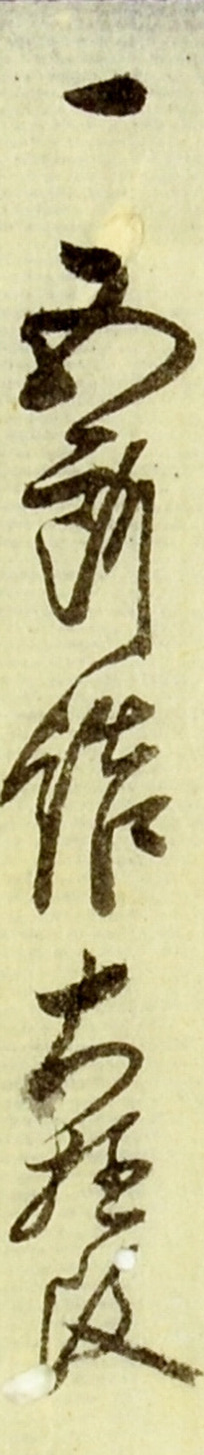一五所詰大極改
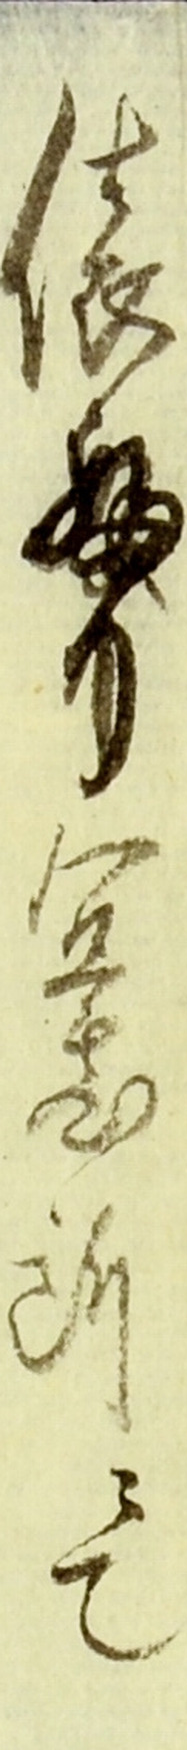俵ふり宜敷所にて
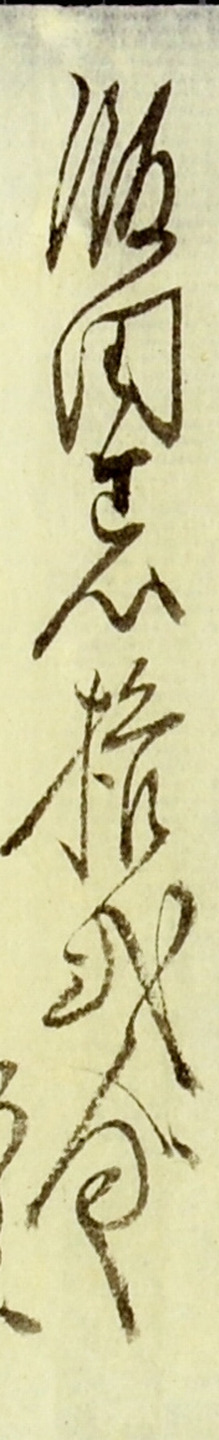飯田着拾弐匁
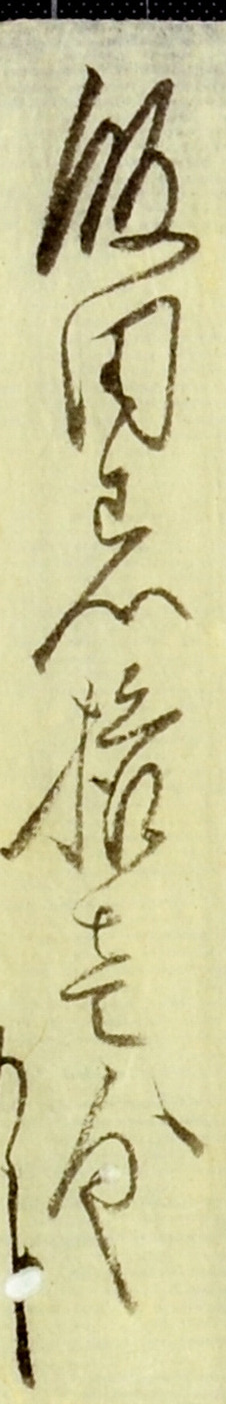飯田着拾壱匁
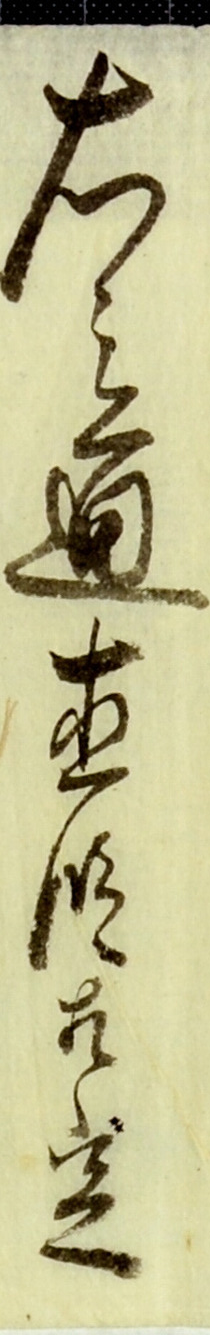右之通直段相定
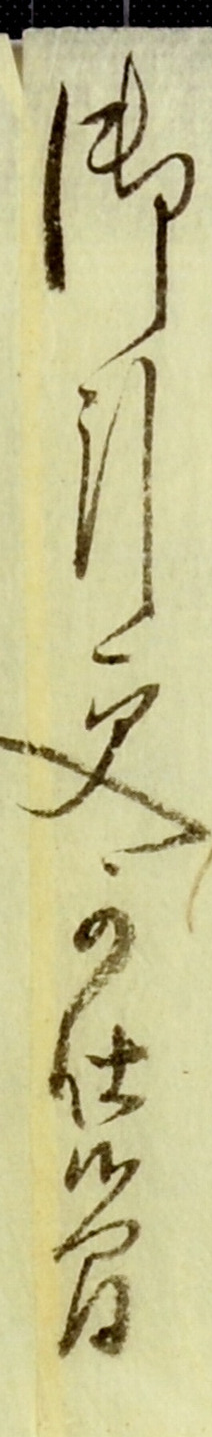御引受可仕候間
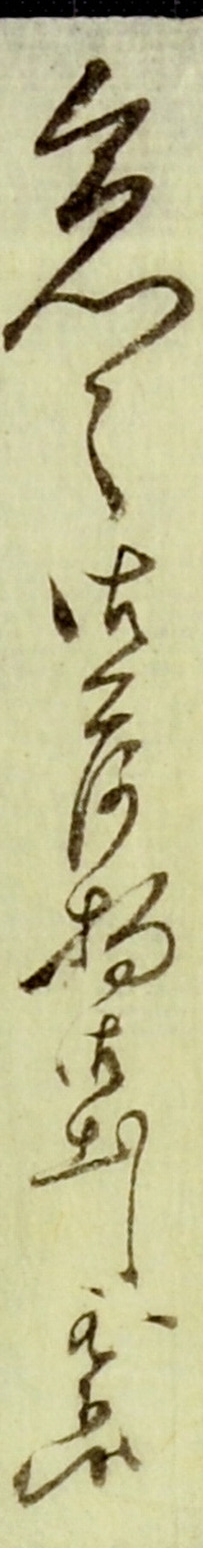急々御荷物御出し可被下候
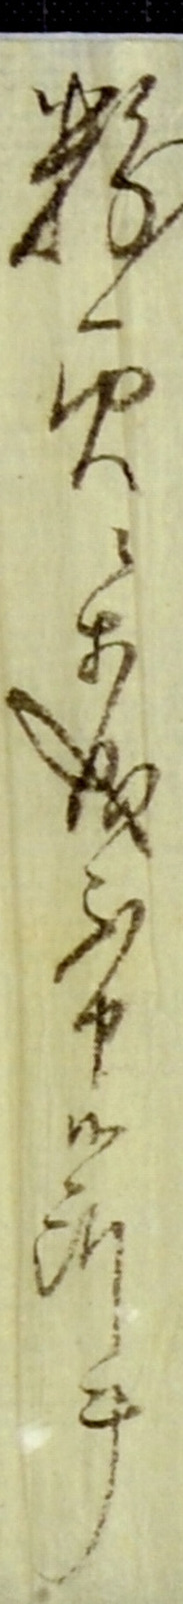粉灰に相成不申候所ヲ

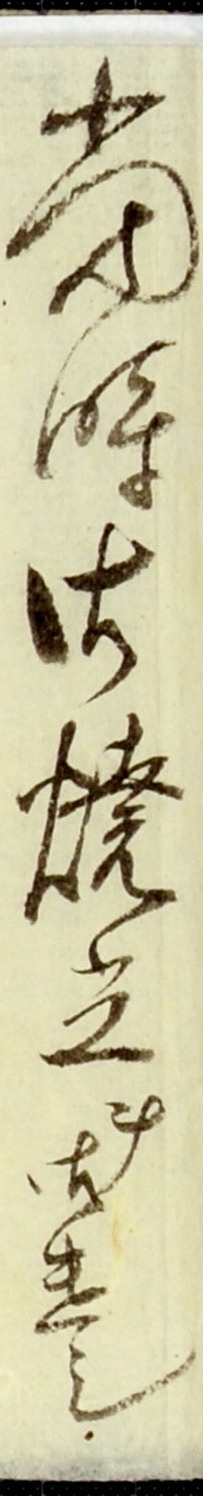当時御焼立ヲ御遣シ
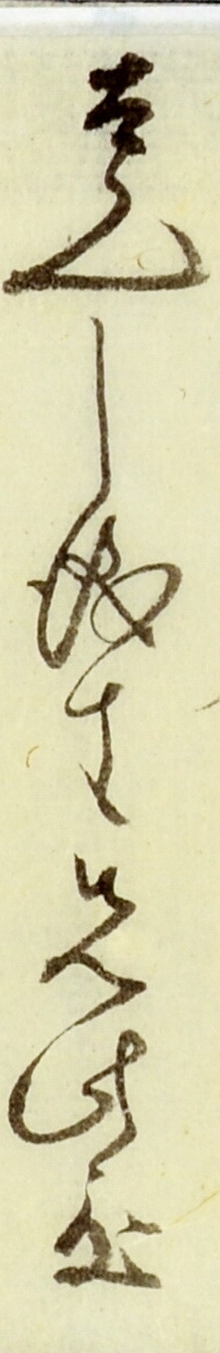ちん之儀は先此度
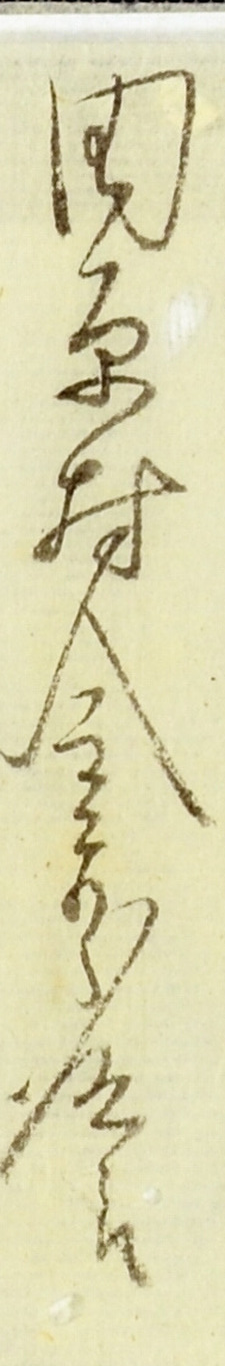田原村金蔵殿え
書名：書状
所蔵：伊那市立高遠町図書館・合同会社AMANE
